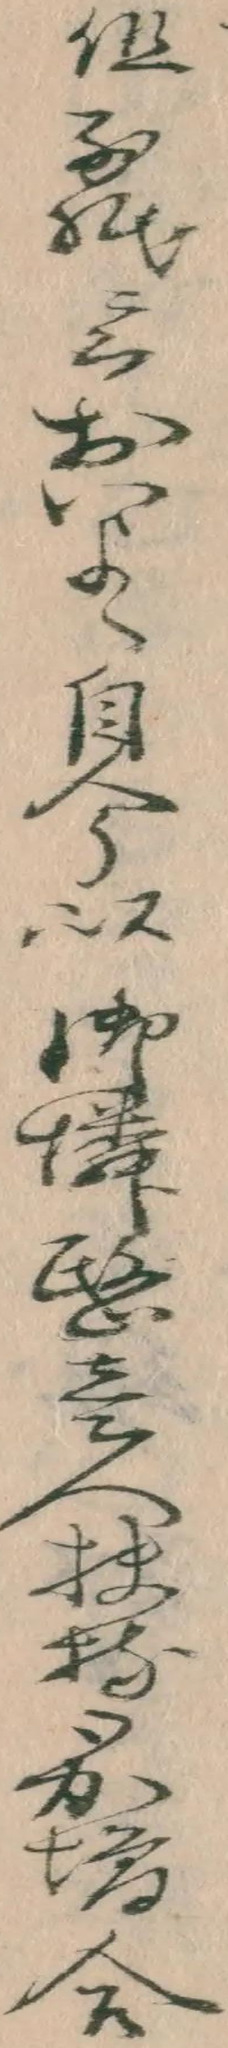但別紙ニ而おいよへ自今以御憐愍壱人扶持御加増合
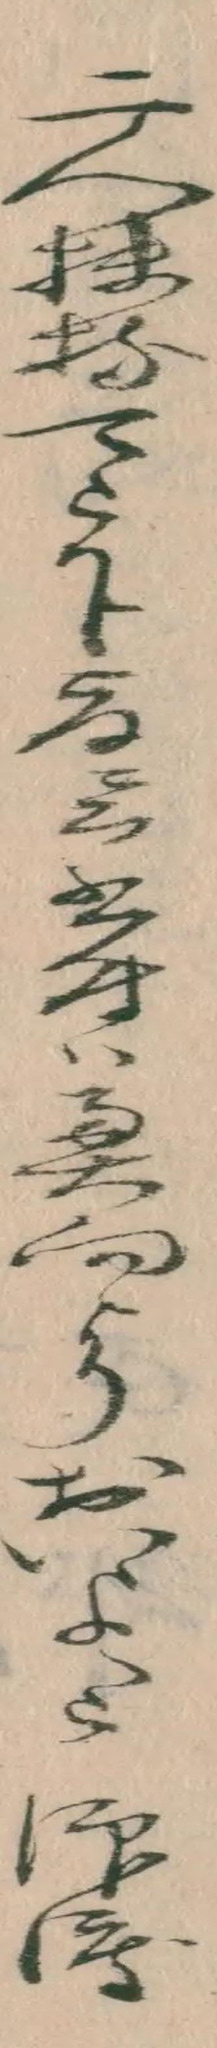二人扶持可被下旨ニ而書付は奥向よりおいよへ被仰渡
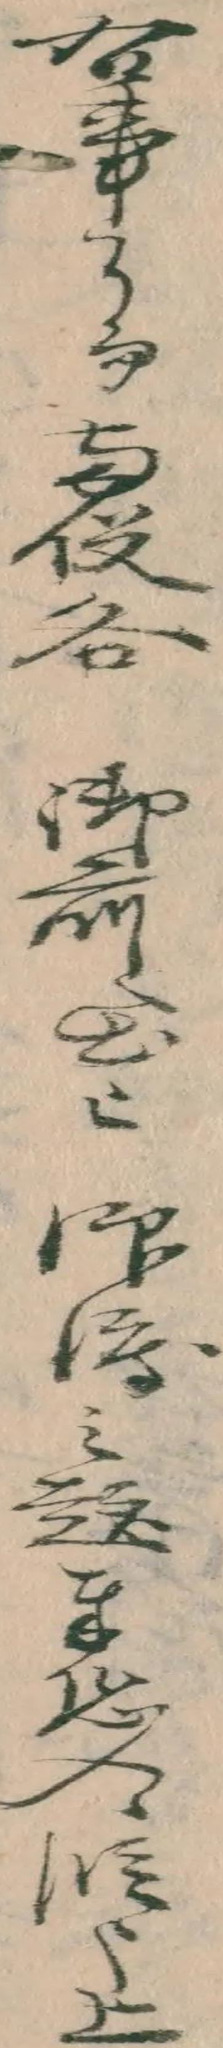右事了而両役各御前へ出被仰渡之趣奉恐入候段申上
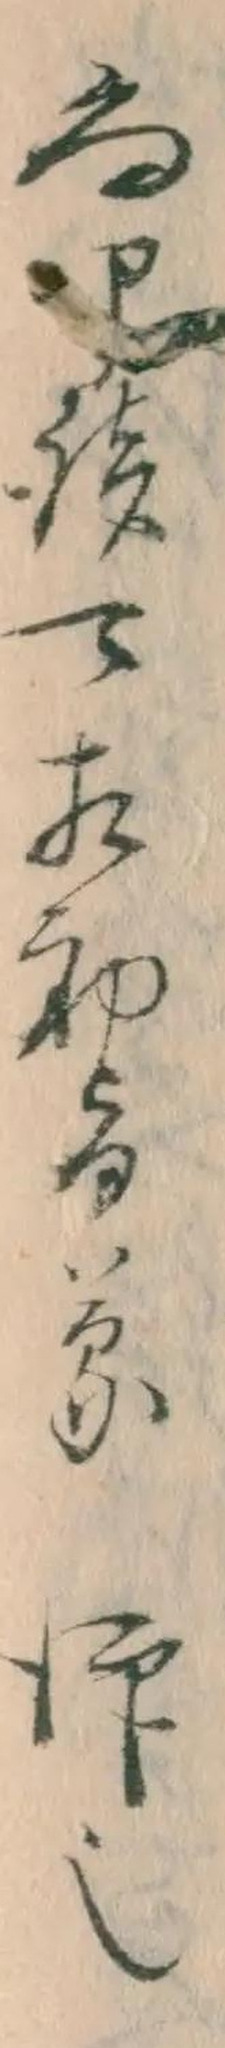尚申談可相初旨蒙仰也
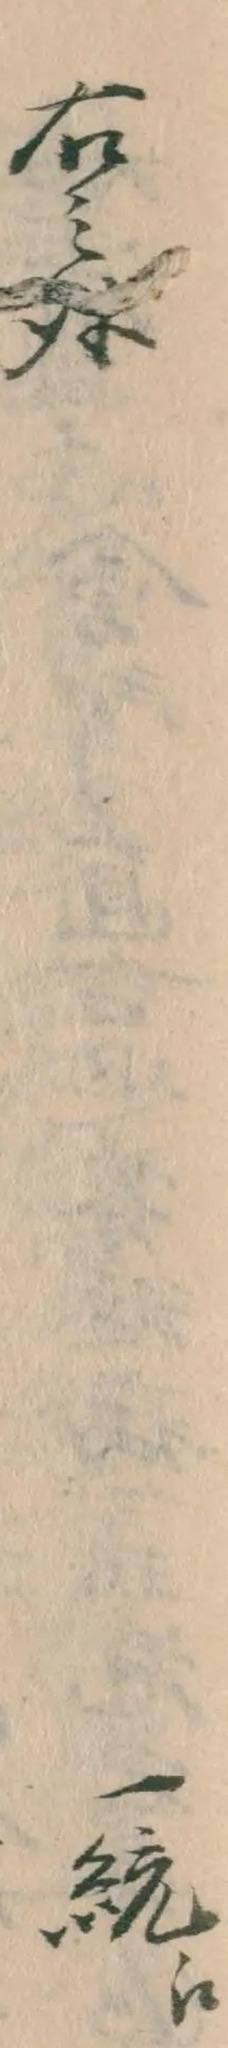右之外一統江
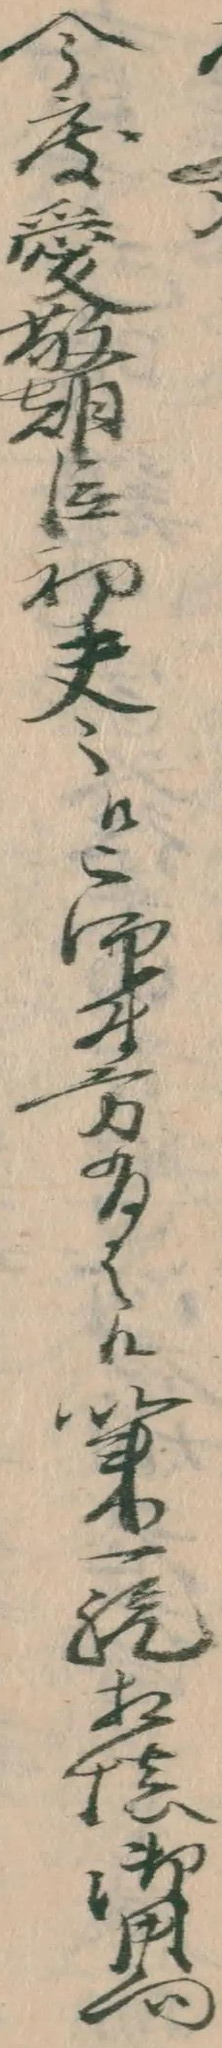今度変敬朝臣初夫々え被仰付方有之候以来一統相慎御用向
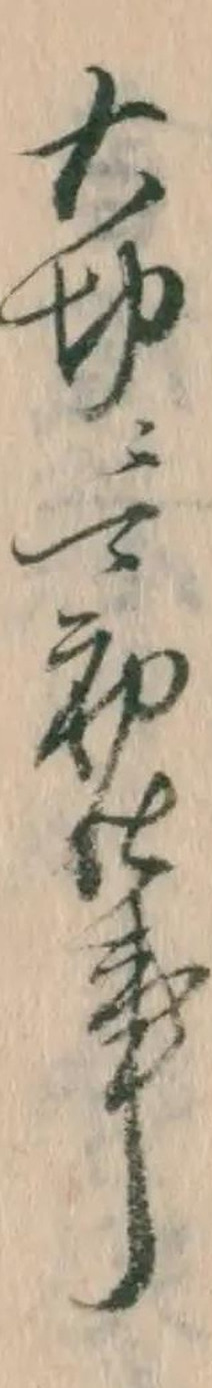大切二可勤仕事
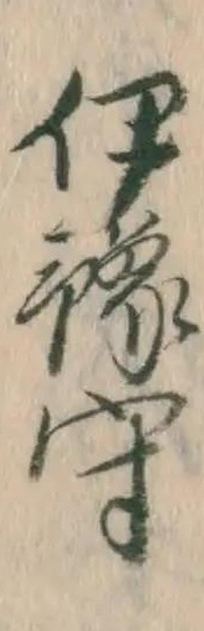伊豫守
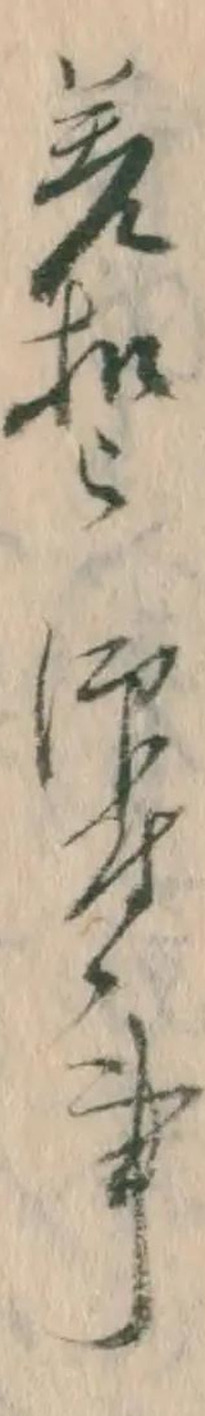差扣被仰付候事
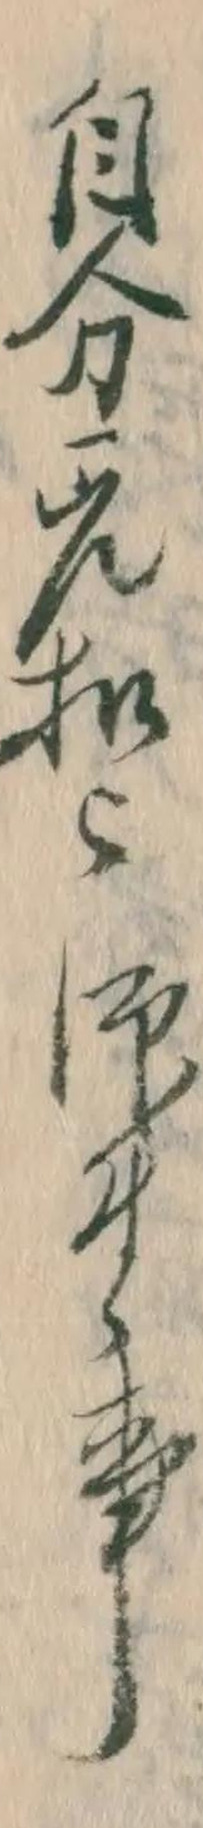自分差扣被仰付候事
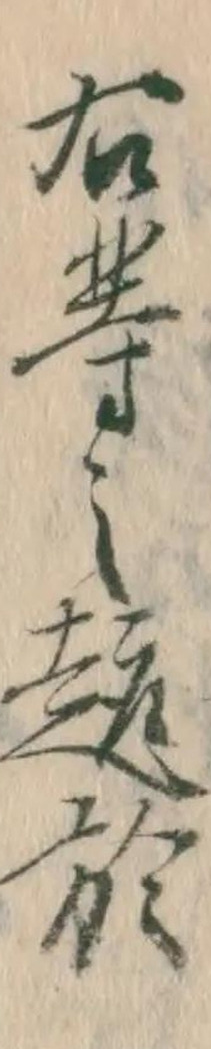右等之趣於
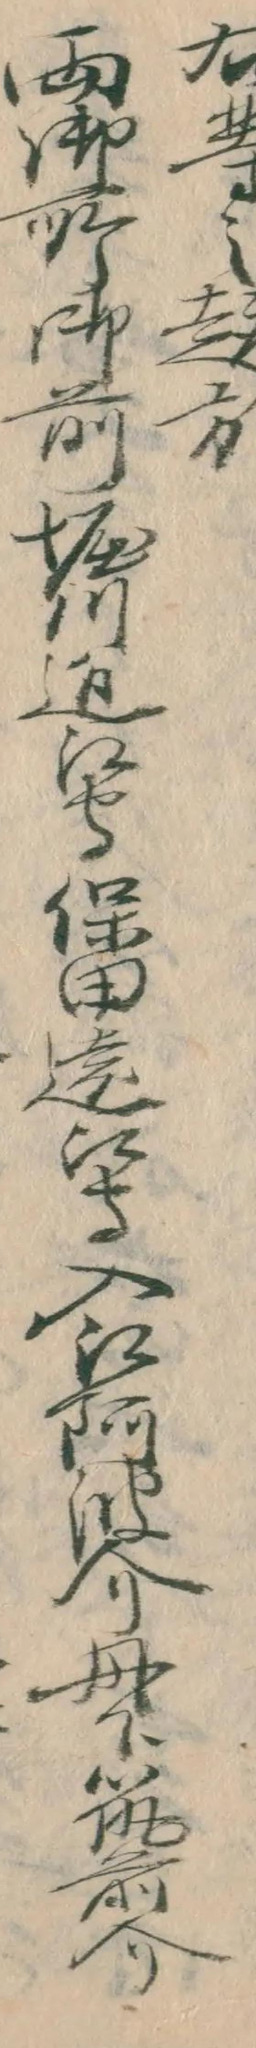両御所御前堀川近江守保田遠江守入江阿波介丹下筑前介
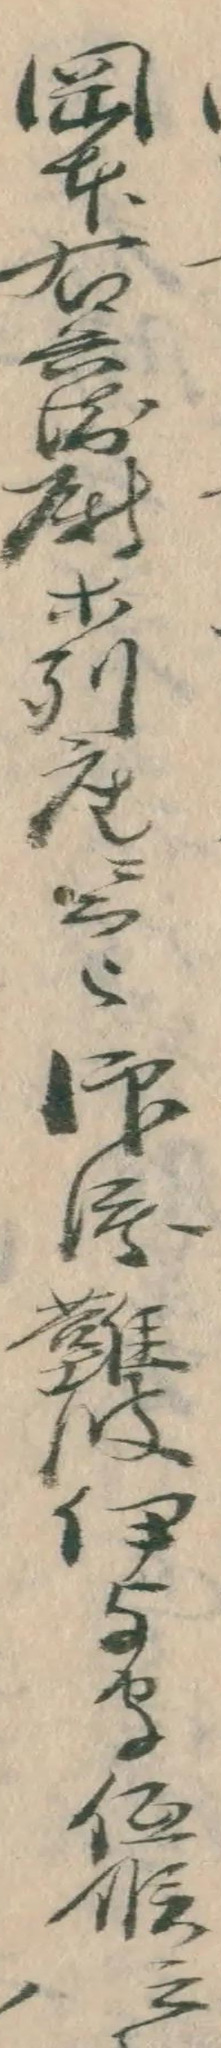岡本右兵衛尉等列座ニ而被仰渡難波伊与守位候云々
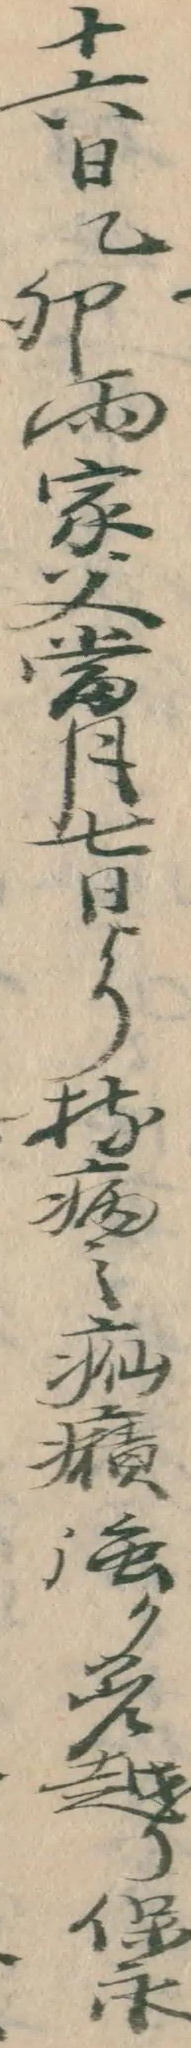十六日乙卯両家父當月七日より持病之疝癪強ク差越り保永
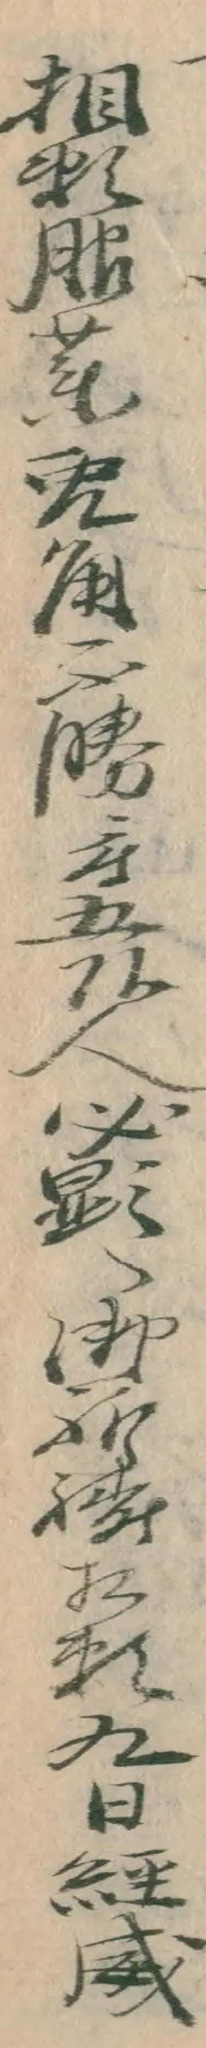相頼服薬兎角不勝ニ付五頭人必顕へ御祈祷相頼九日経威

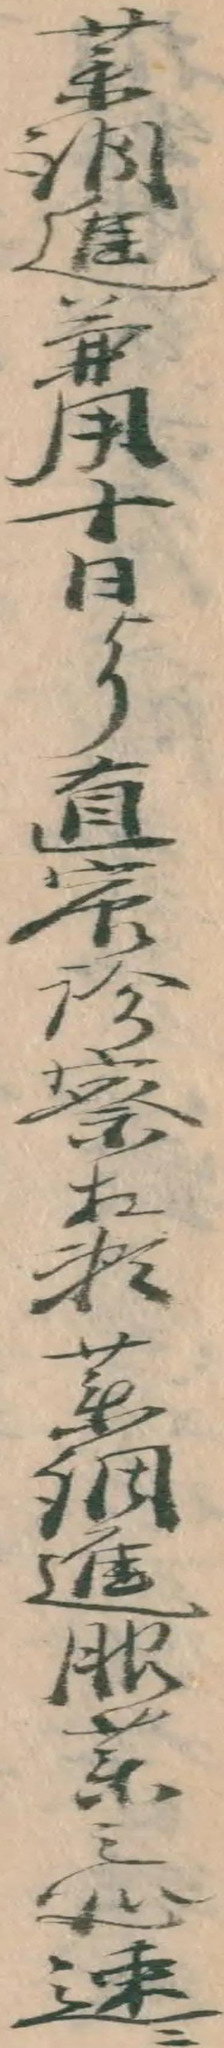薬調進兼用十日より直寝診察相頼薬調造服薬之出速ニ
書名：賀茂社記録. 第65冊
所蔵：国立国会図書館 National Diet Library, JAPAN
